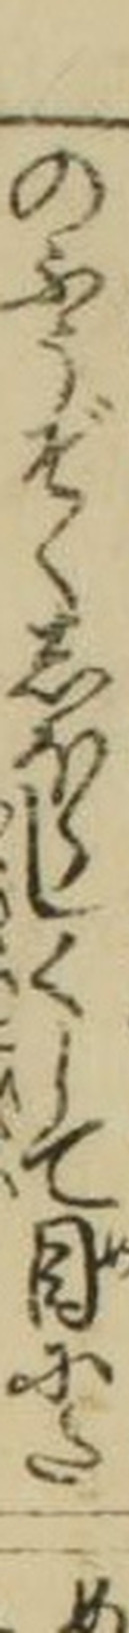のふうぞくしほらしくして目にた
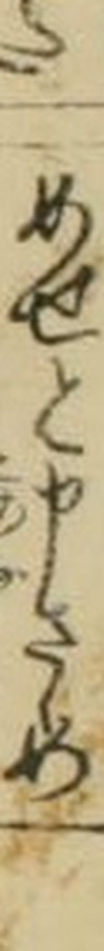めせと申さしめ
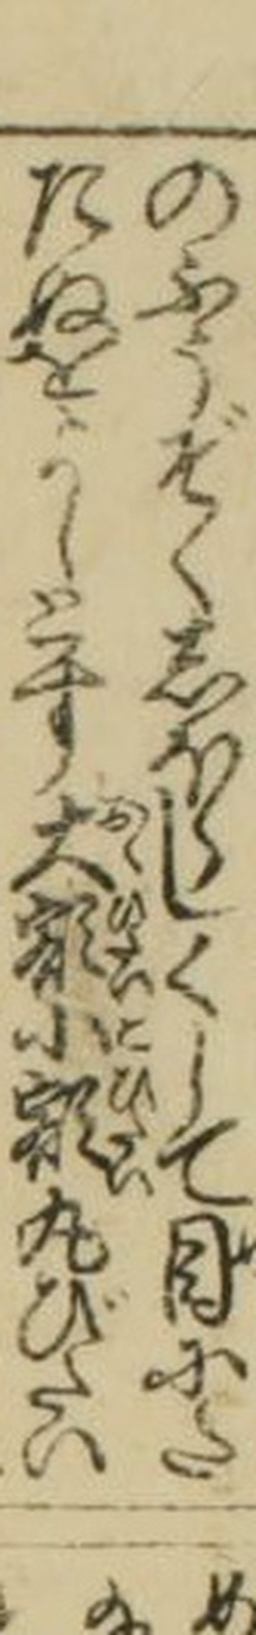たぬをよしとす大額小額丸びたい
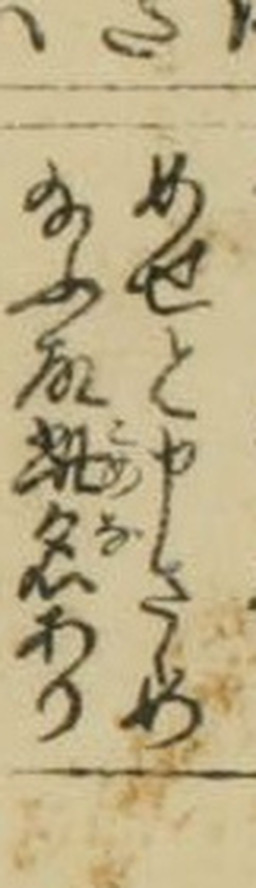給ふ故此名あり
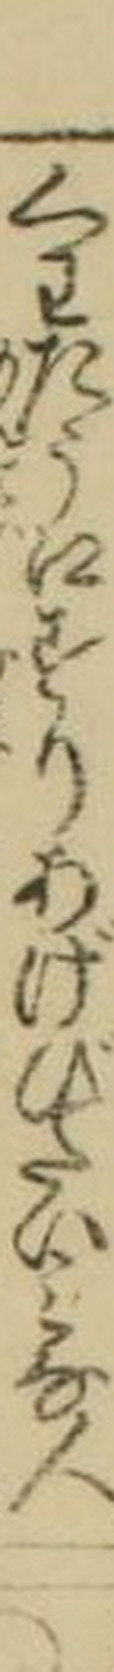くわたう口すりあげびたいみな人
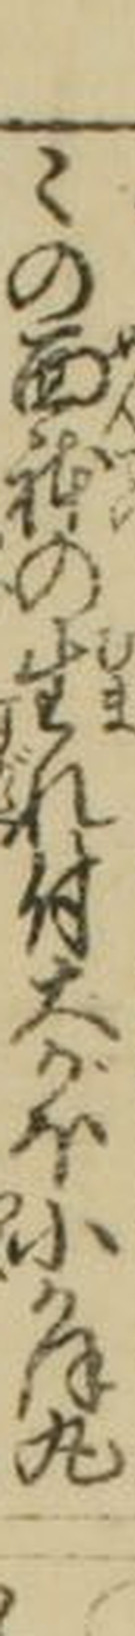この面躰の生れ付大がほ小かほ丸
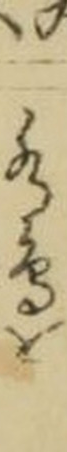水鳥を
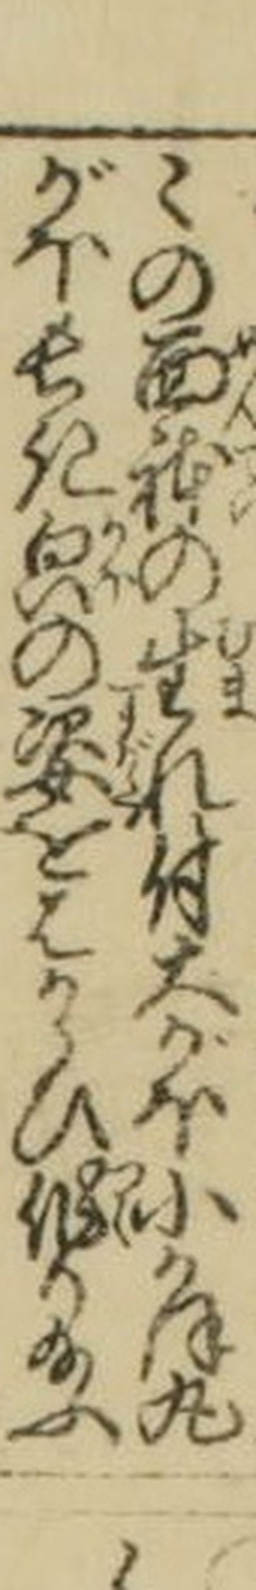がほ長き㒵の姿をはからひ作り給ふ
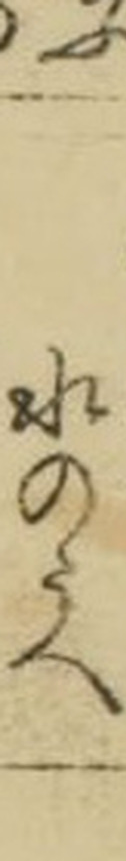水のうへ
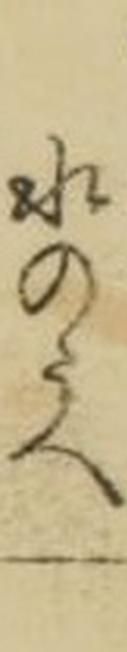水のうへ
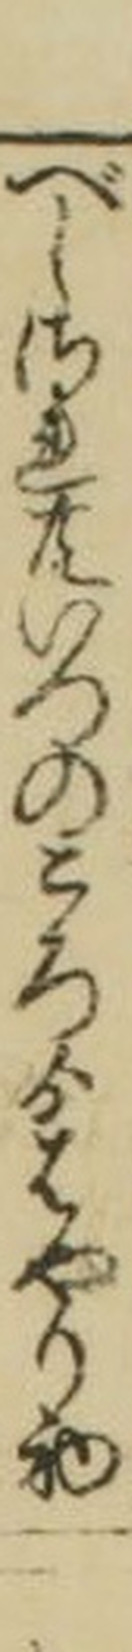べしされ共いつのころよりはやり初
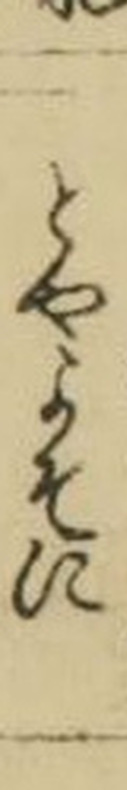とやよそに
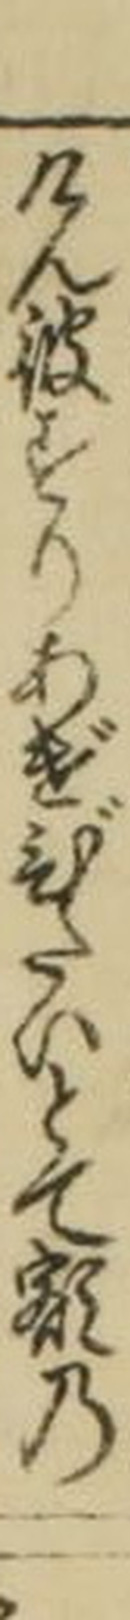けん彼すりあげびたいとて額の
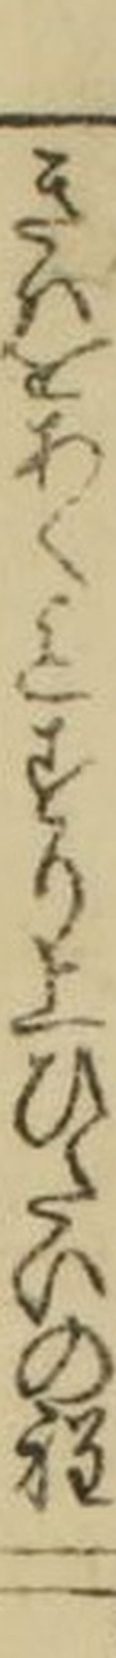きはをあく迄すり上ひたいの程
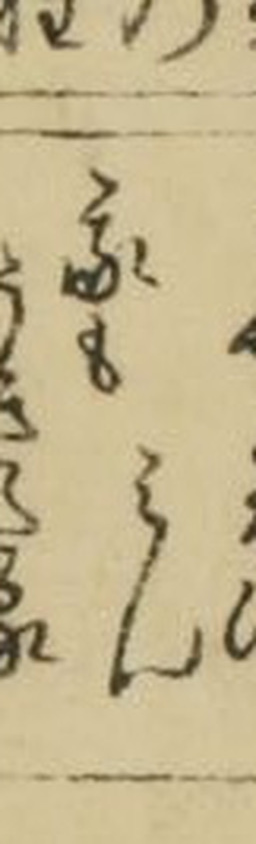うきたる
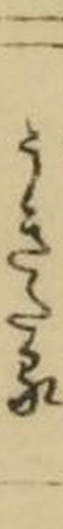うきたる
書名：女源氏教訓鑑
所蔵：東京学芸大学附属図書館
